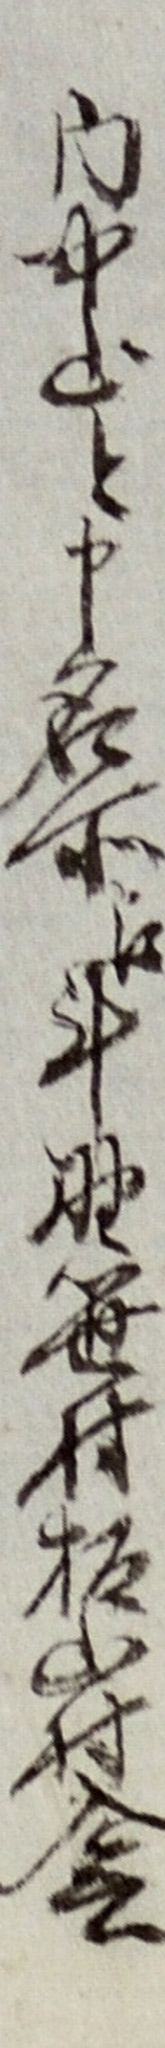内中山と申名前江斗野笹村板山村入会
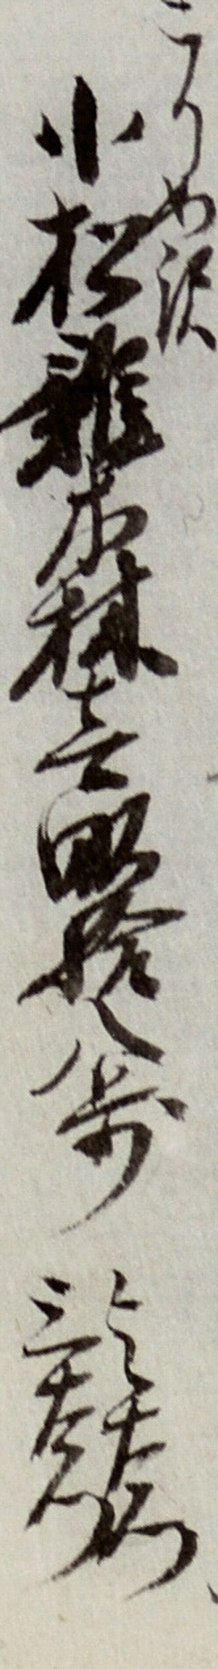小松雑木林壱畝拾八歩与右衛門
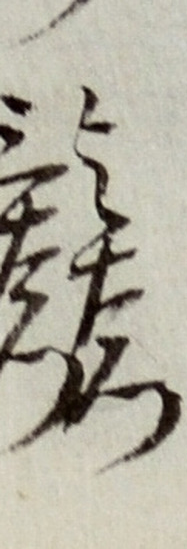三右衛門
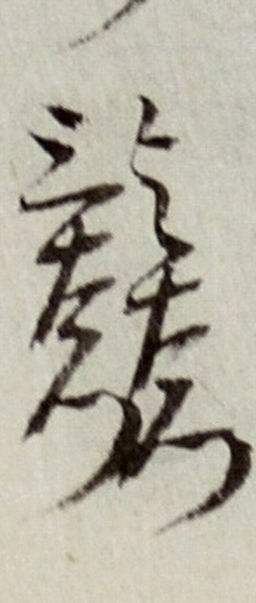三右衛門
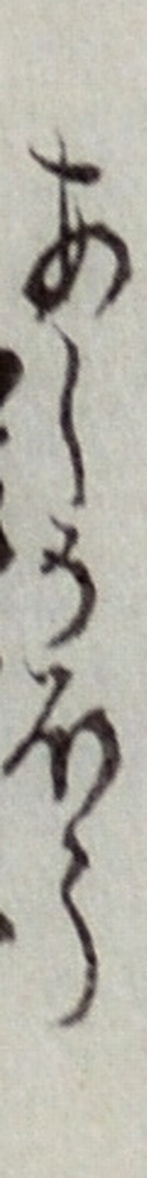あしうほら
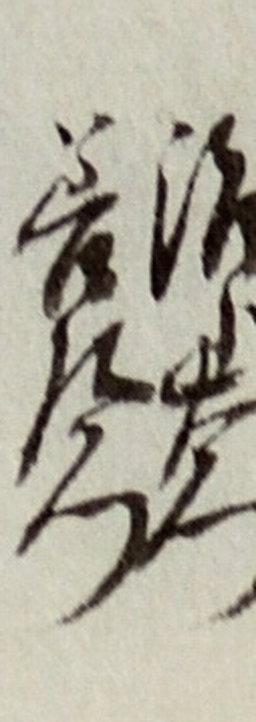善左衛門
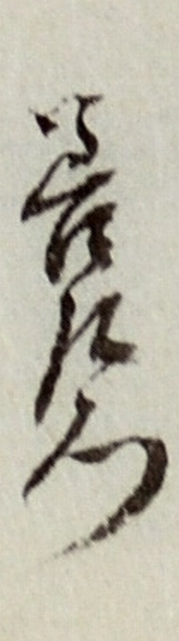善左衛門
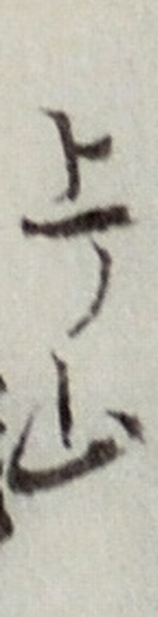上ノ山
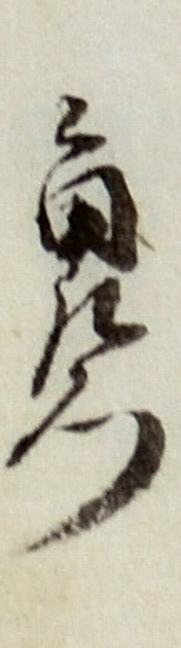善左衛門
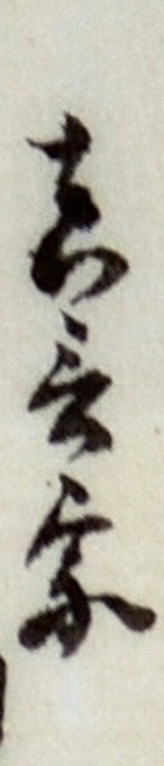真言宗
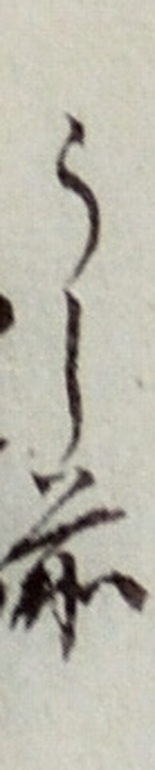うら前
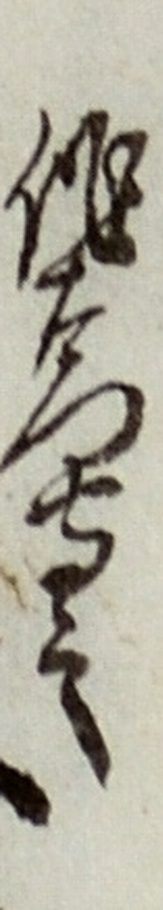作右衛門守之
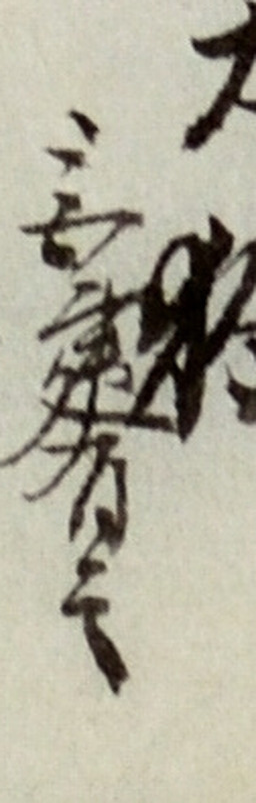宮建有之
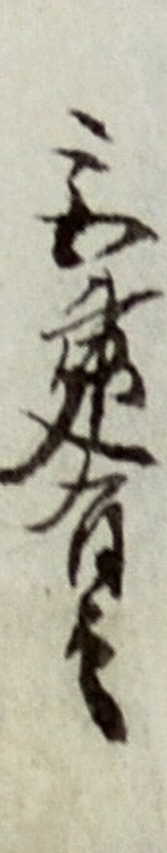宮建有之
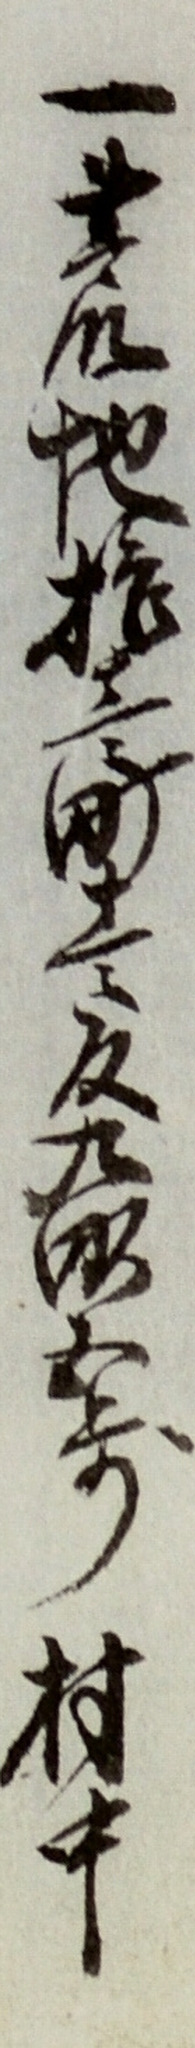一荒地拾壱町壱反九畝五歩村中
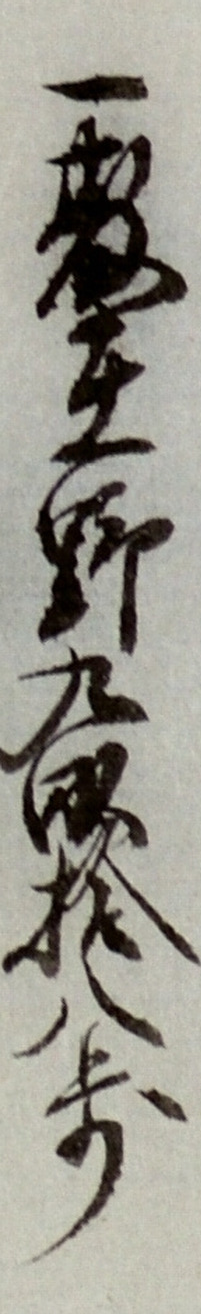一散在野九畝拾八歩
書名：御領分中山林社地手控
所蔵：伊那市立高遠町図書館・合同会社AMANE
